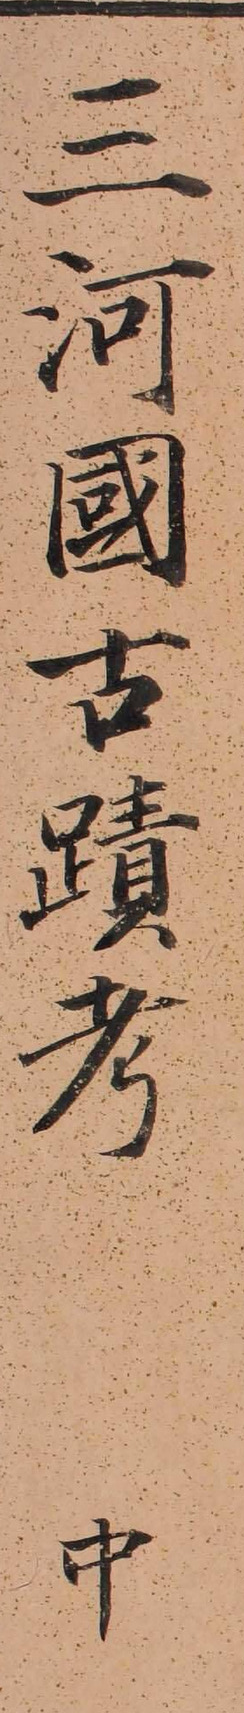三河国古蹟考中
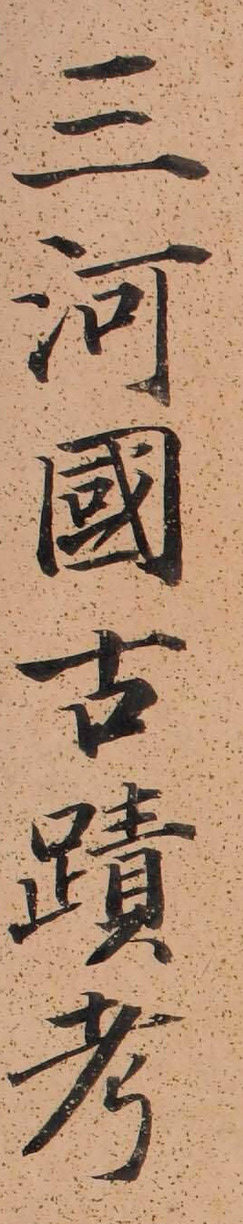三河国古蹟考中

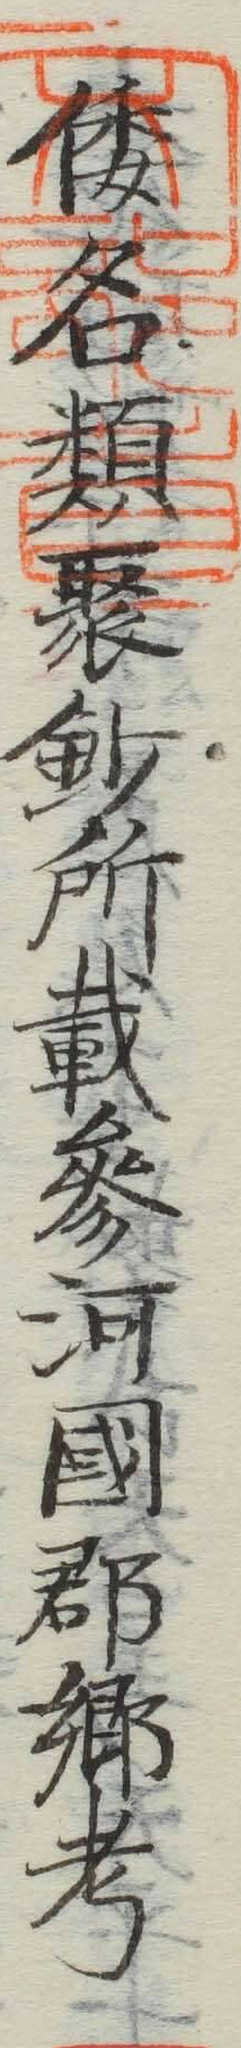倭名類聚鈔所載参河國郡郷考三井家
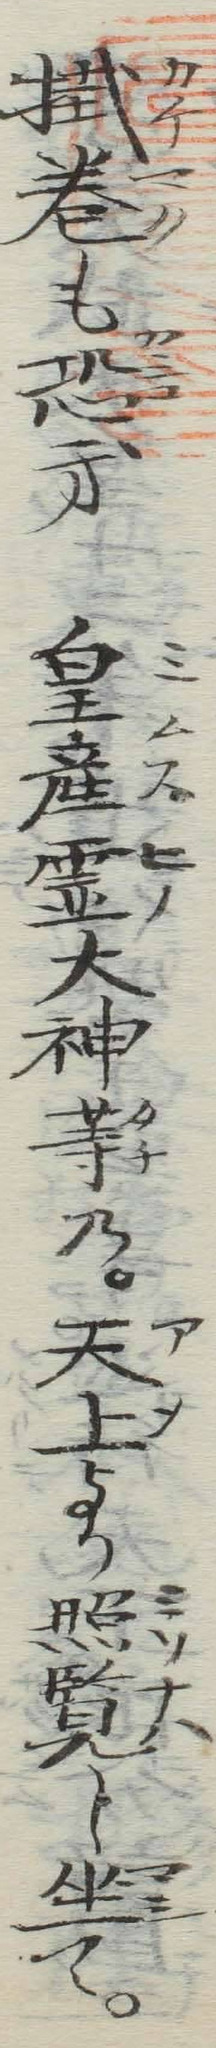掛巻も恐き皇産霊大神等の。天上より照覧し坐て。
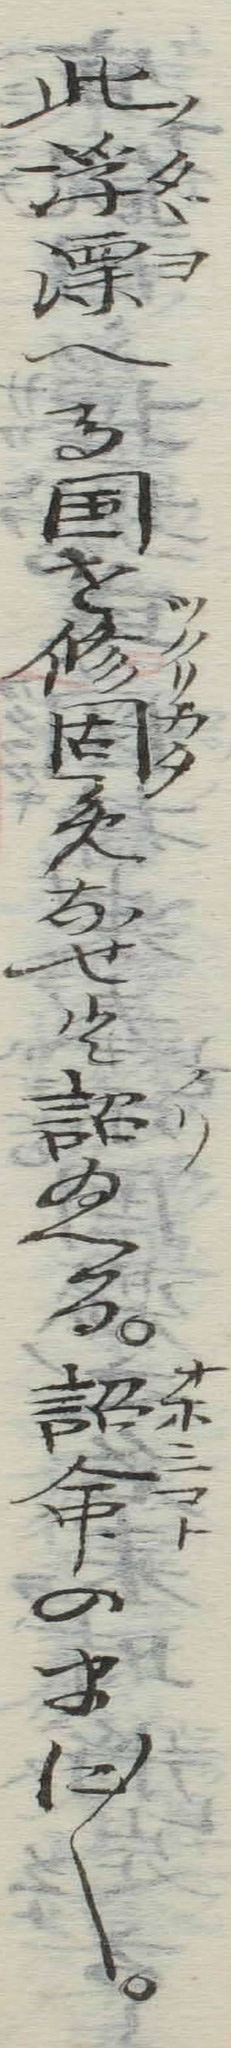此浮漂へる国を修固めなせと詔給へる。詔命のまに〳〵。
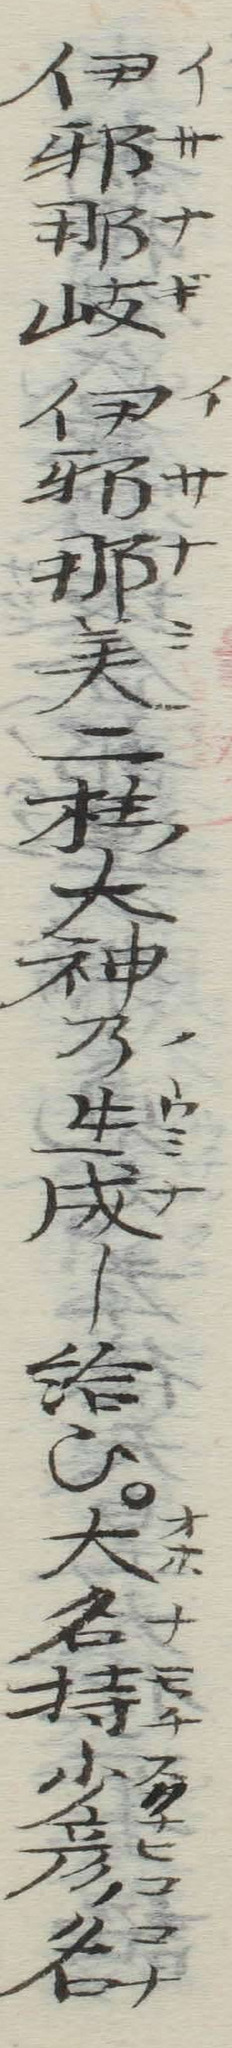伊邪那岐伊邪那美二柱大神乃生成し給ひ。大名持少彦名
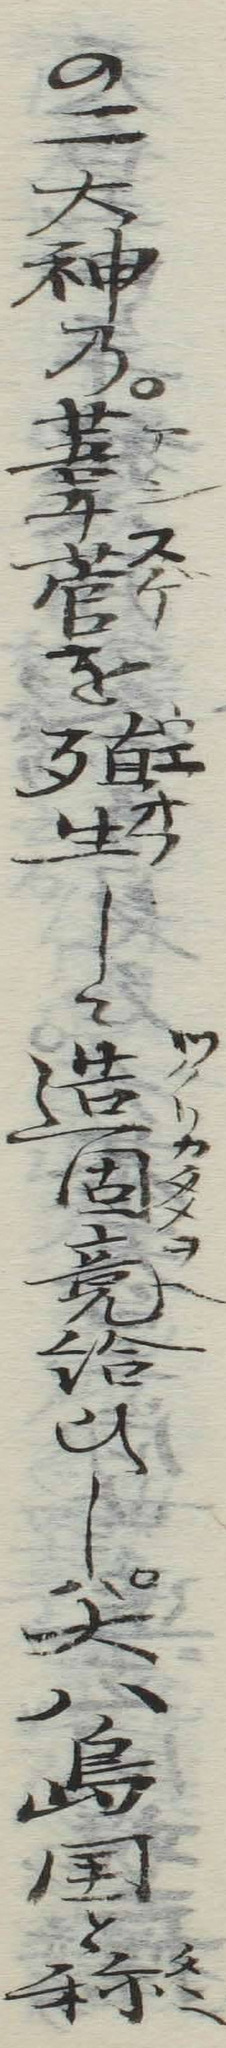の二大神の。葦菅を殖生して造固竟給ひしは。大八島国と称

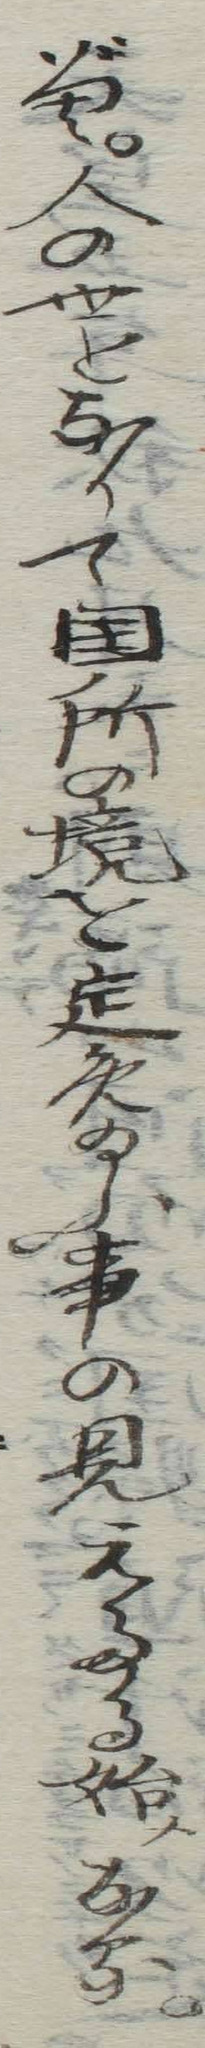ぞ。人の世となりて国所の境を定め給ふ事の見えたる始なる。
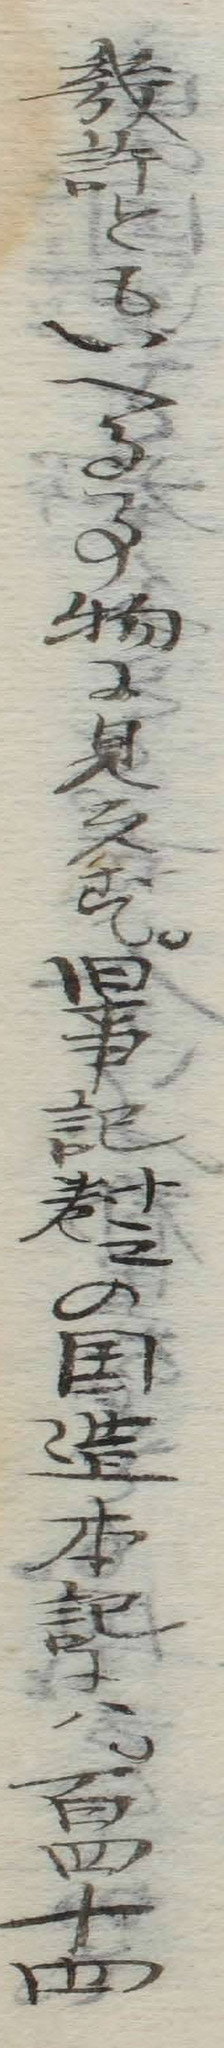幾許ともいへる事物に見えす。旧事記十之巻の国造本記には。百四十四

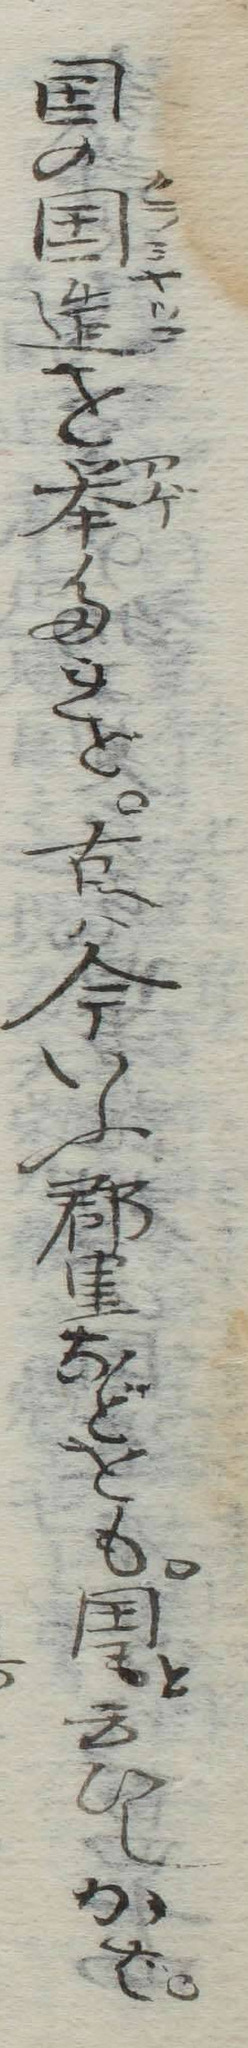国の国造を挙たれど。古は今いふ郡里などをも。国云ひしかば。
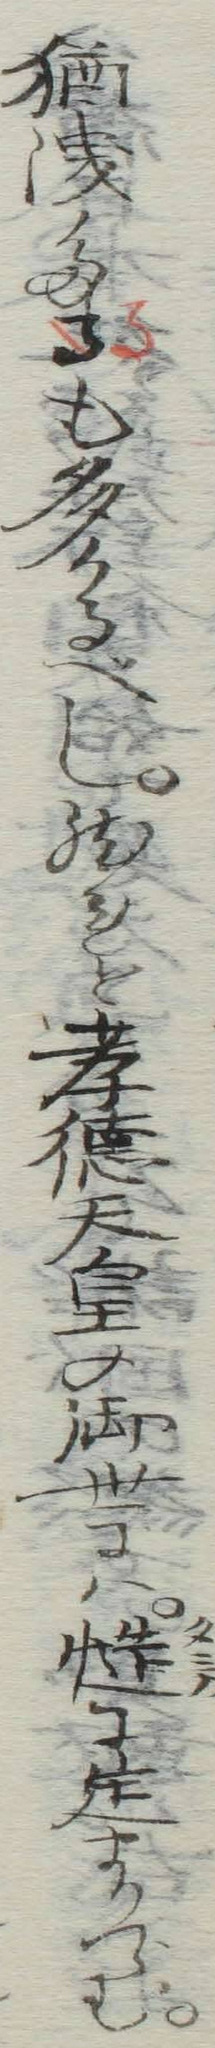猶もれ洩たるも多かるべし。然れと孝徳天皇の御世には。慥に定まりつらむ。
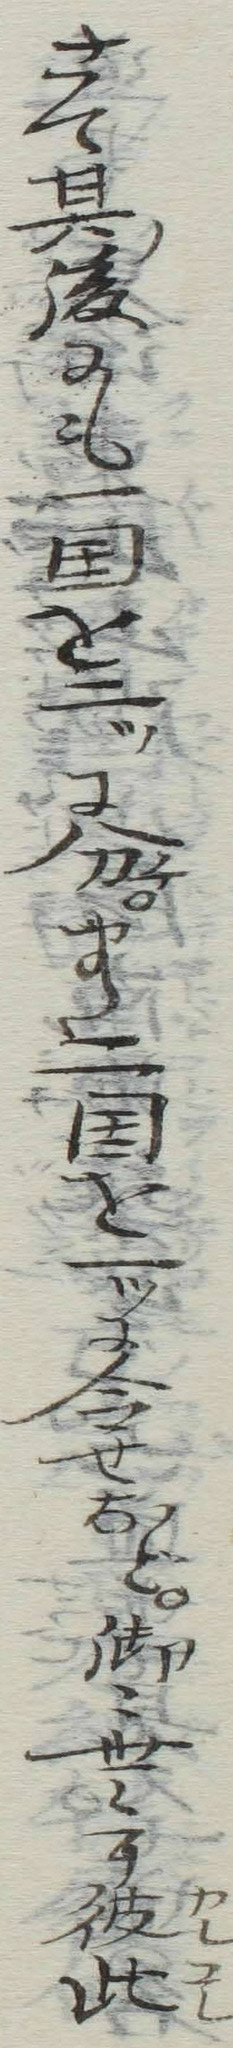さて其後にも一国を二分。また二国を一合せなど。御々世々に彼此
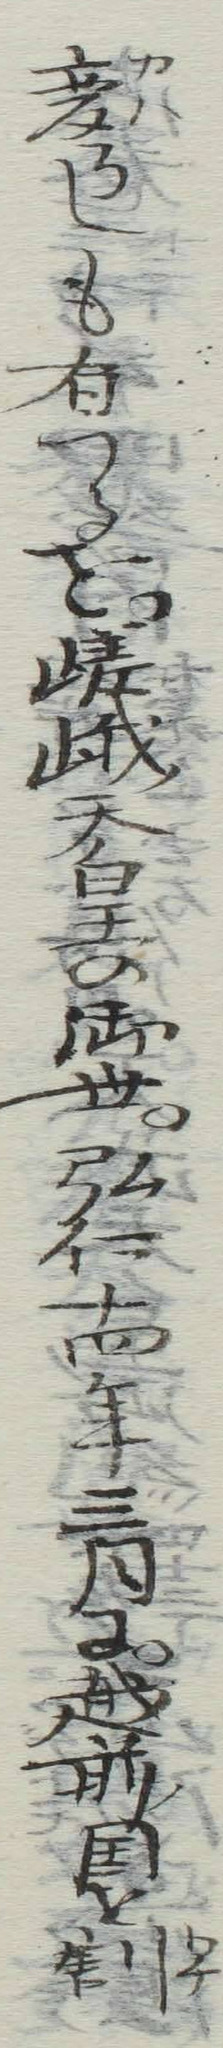変りしも有つること。嵯峨天皇の御世。弘仁十四年三月に。越前国を割
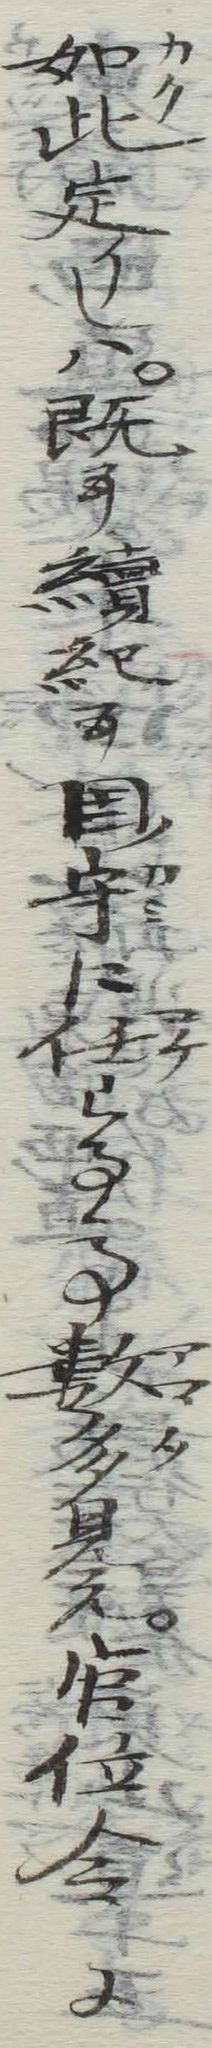如此定りしは。既に続紀に国守に任らるゝ事数多見え。官位令に
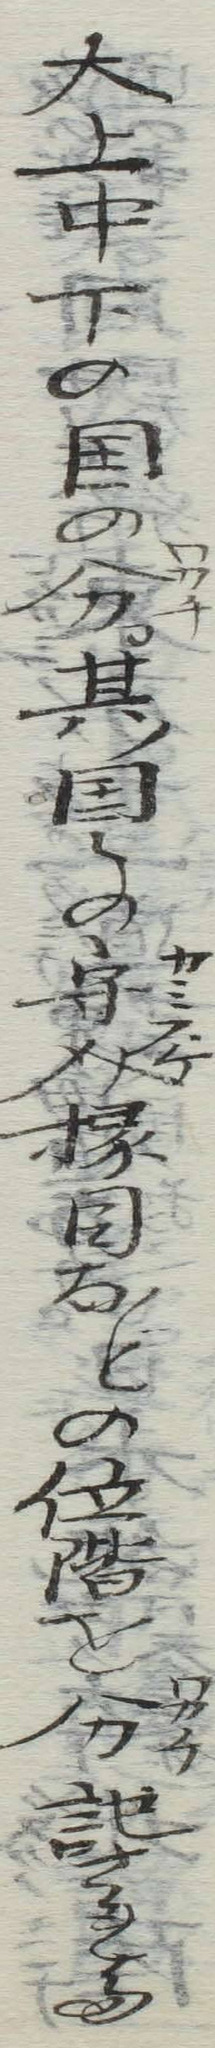大上中下の国の分。其国々の守介掾目などの位階を分記された
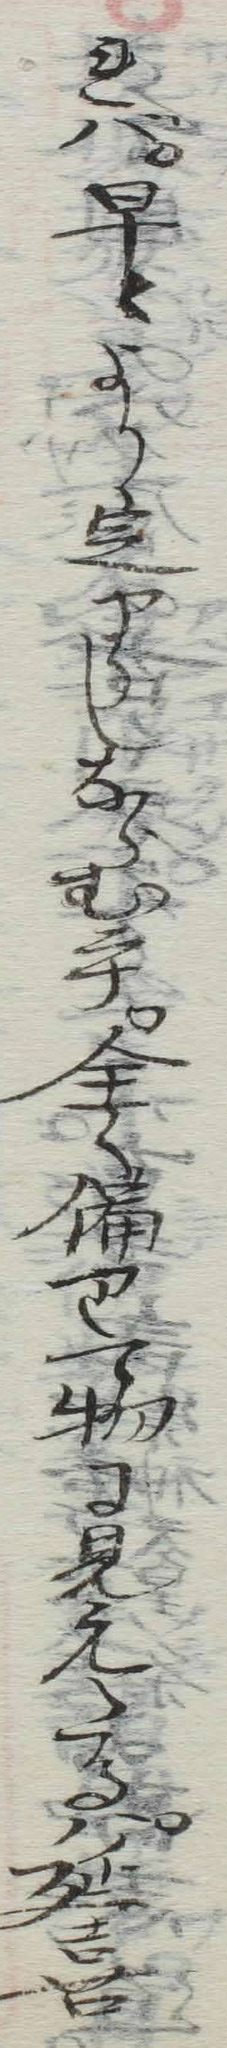れば。早くより定まりしならむを。全く備りて物に見えたるは。延喜
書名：三河国古跡考
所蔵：国文学研究資料館
